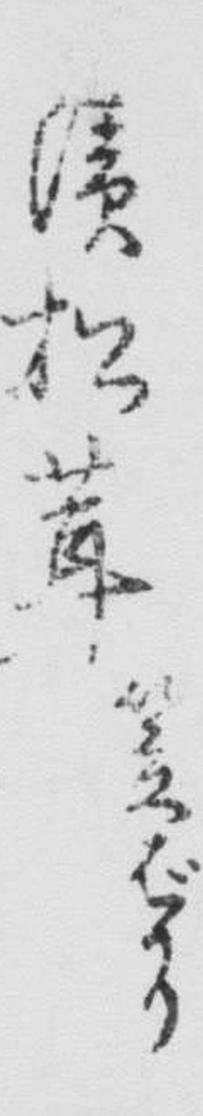漬松茸笠ばかり
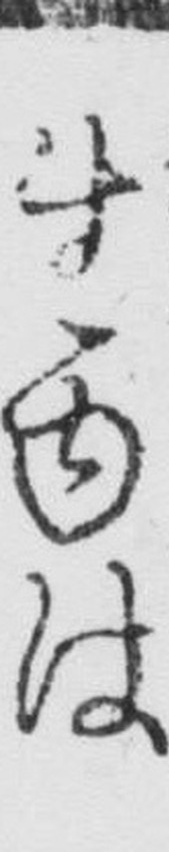生ゆは
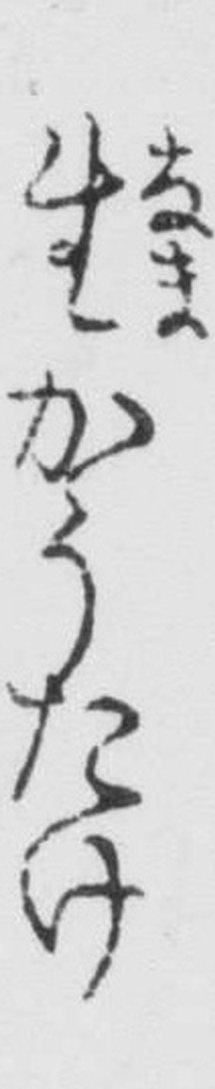生かうたけ
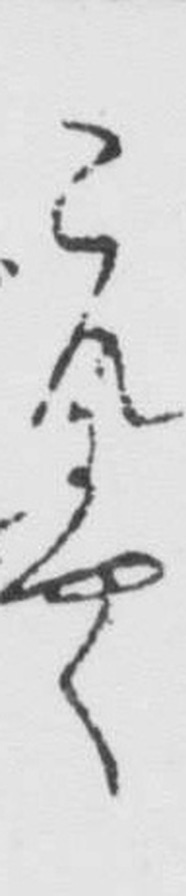こんにやく
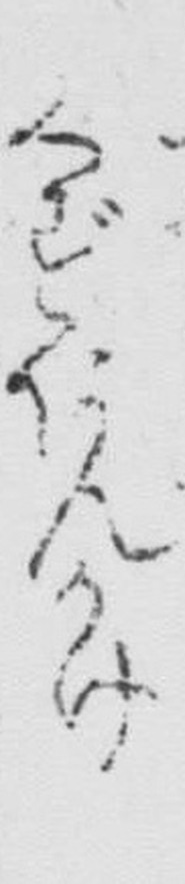くずあんかけ
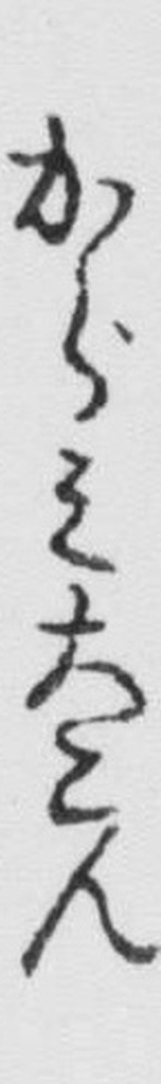からみ大こん
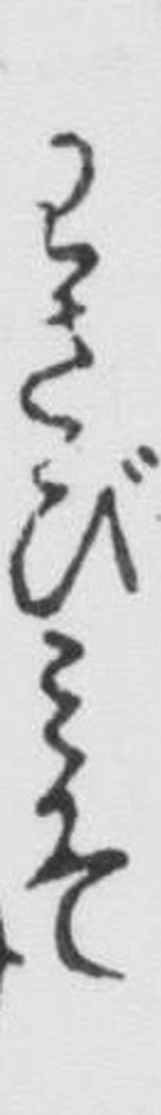わさひみそ
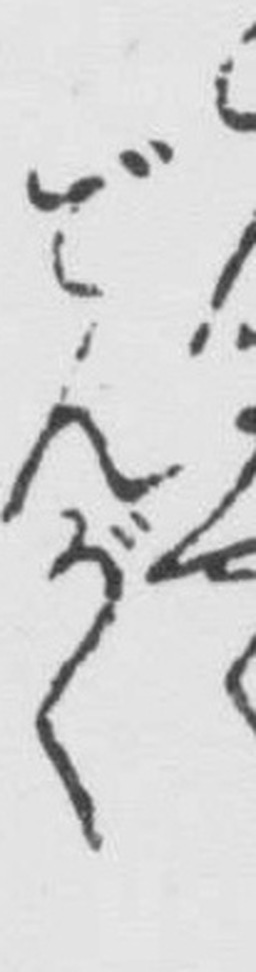でんがく
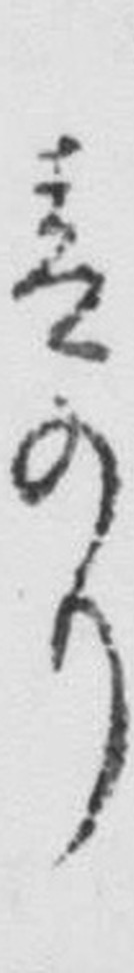青のり
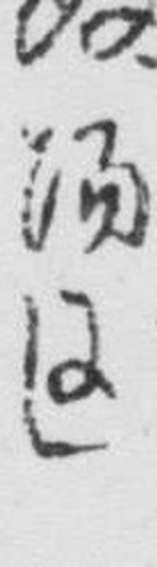湯にし
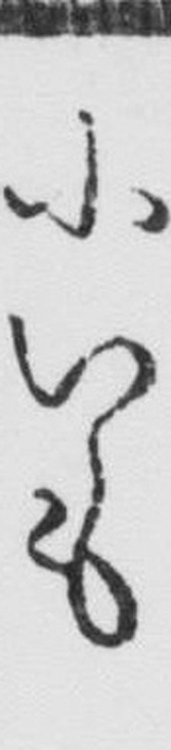小いも
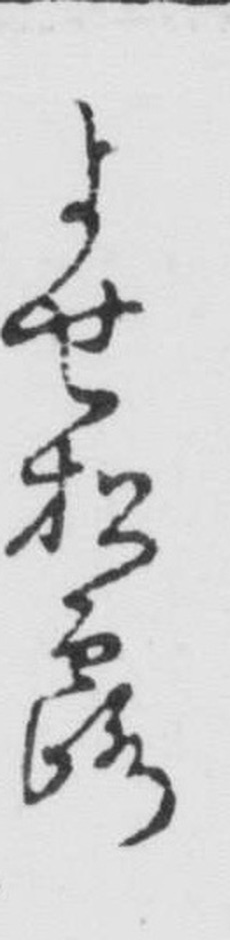よせ松露
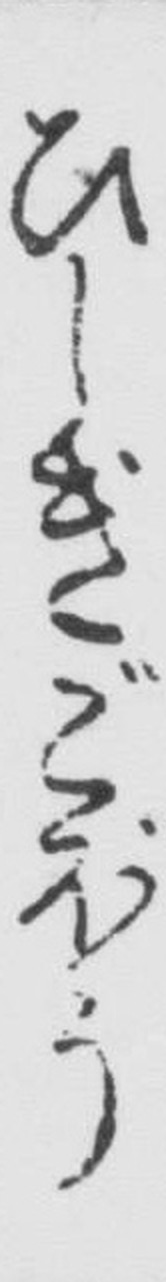ひしきごぼう
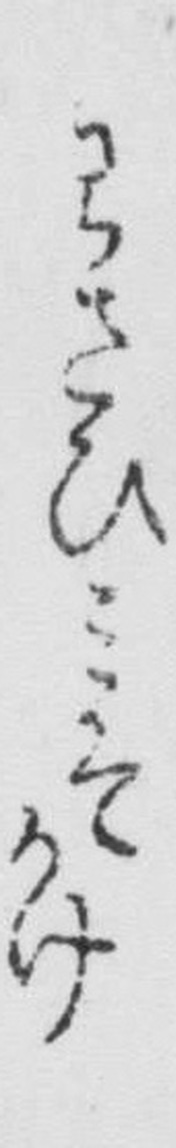わさひみそかけ
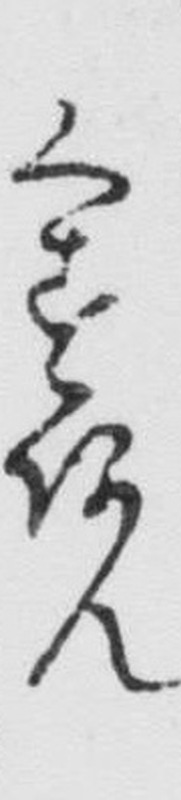くすあん
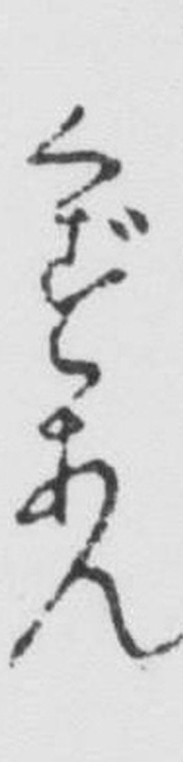くずあん
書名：諸家通用/即席料理
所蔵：大阪府立大学学術情報センター 国文学研究資料館
